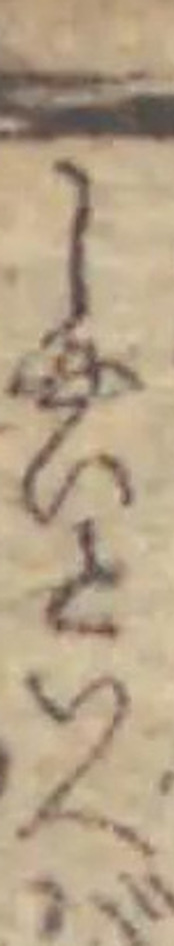しやいといへば
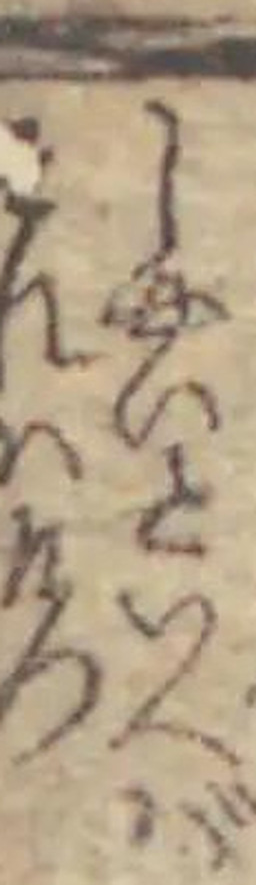それはけつ
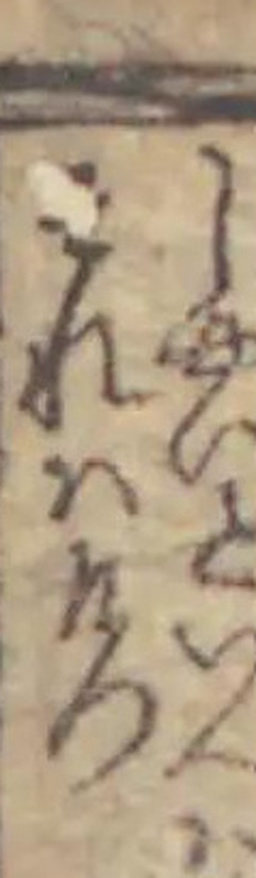それはけつ
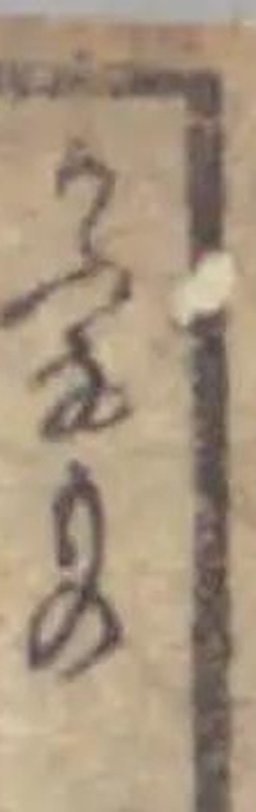かふなもの
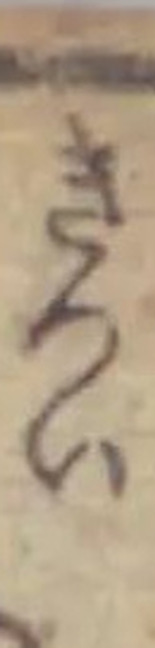きつい
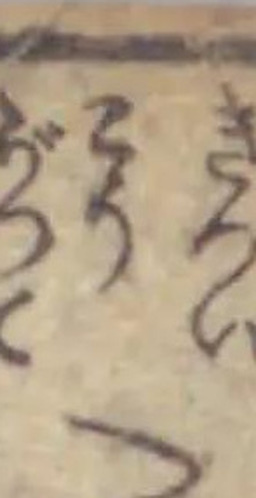ぶつて
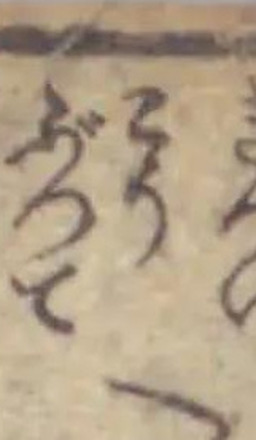ぶつて
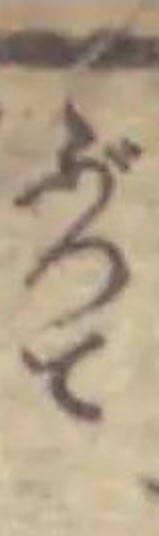ぶつて
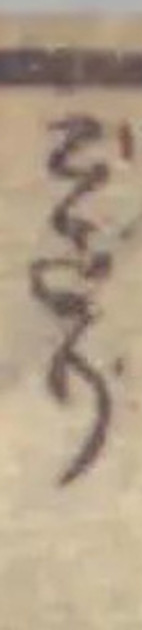ごさり
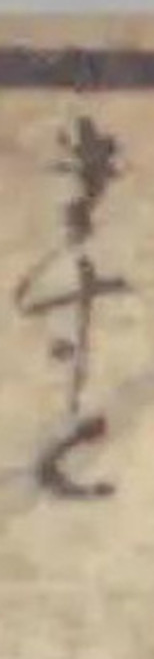ますと
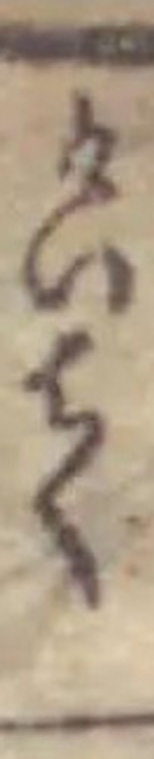けいはく
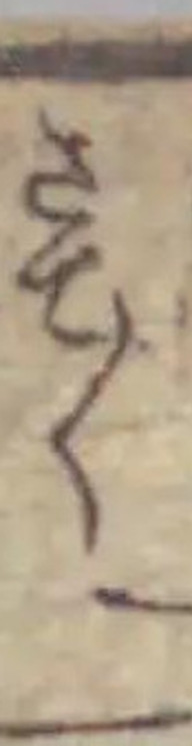さて〳〵
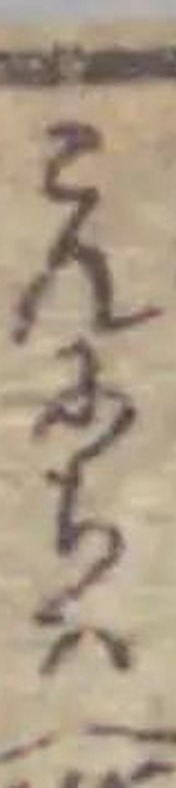こんにちは
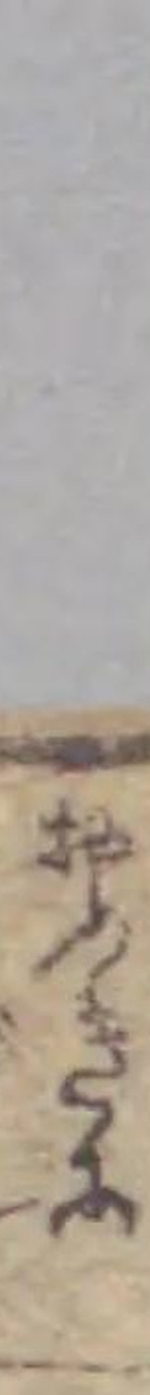おふきに
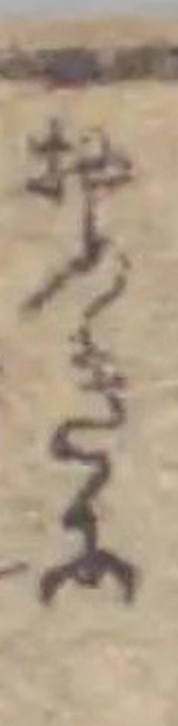おふきに
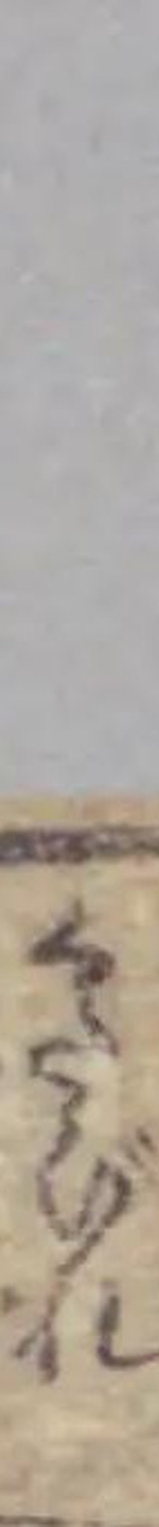くたびれ
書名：もふもふもふ怖噺 2巻
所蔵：国立国会図書館 National Diet Library, JAPAN
